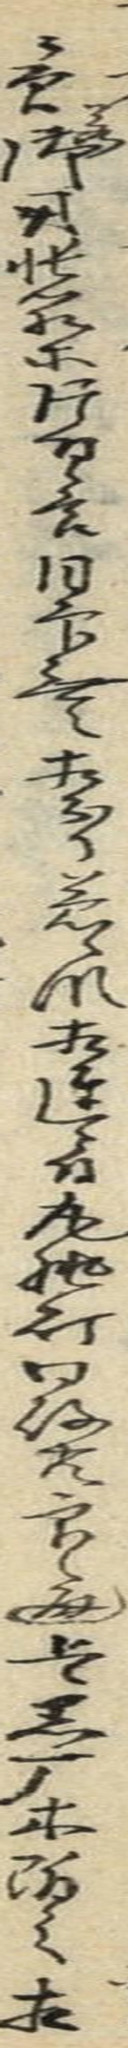に而は御用帳箱等片付候節目印無之相分り兼候段相達候に付丸挑灯同役共印之通上候黒厂木附之相
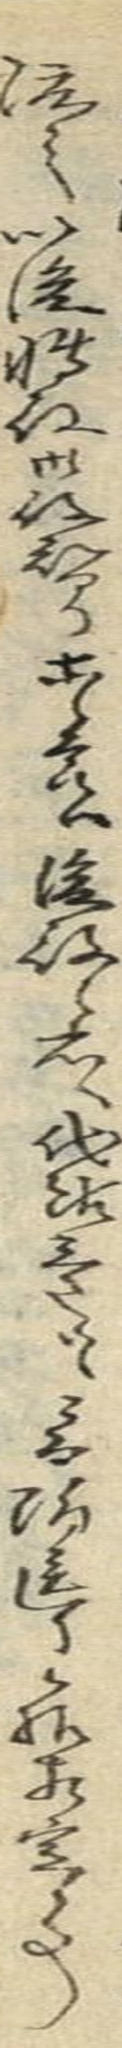渡之以後転役御役替り等之節は後役之者へ代銀三匁つゝに而附送り候様相定候事
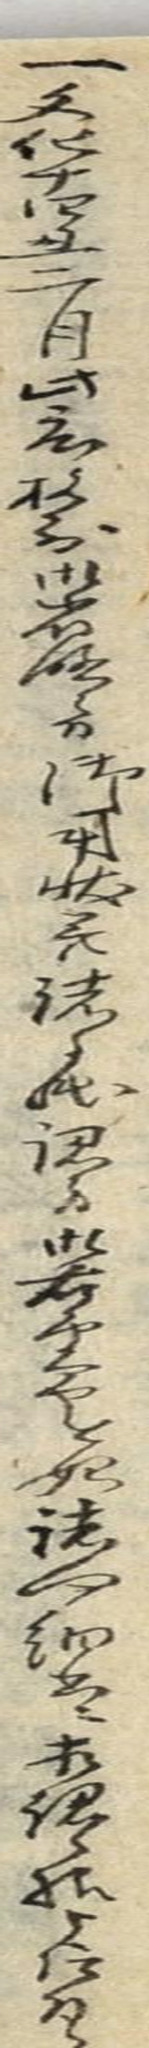一文化十四丑此度格別御省略に付御用状并諸手紙認方御右筆部屋を始諸向細書に相認候様被仰付候事
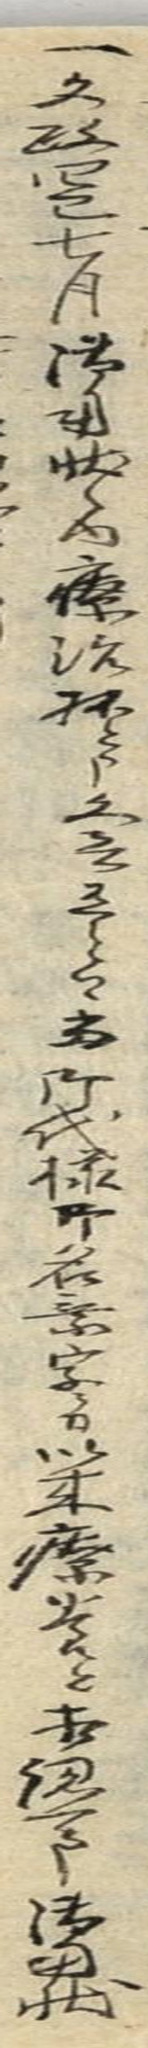一文政四巳七月御用状之内療治抔と申文言有之候はゝ当御代様御名乗字に付以来療養と相認可申御用状
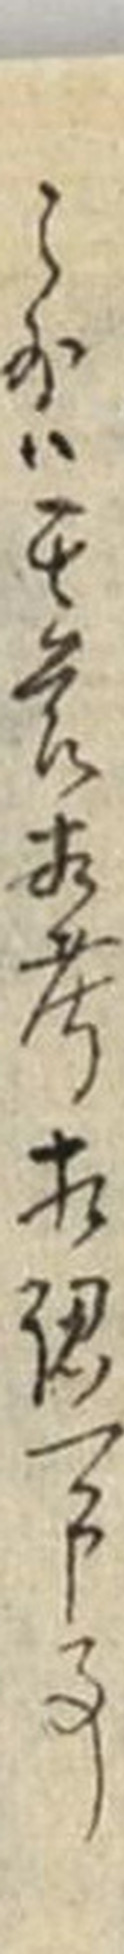之外は其節相考相認可申事
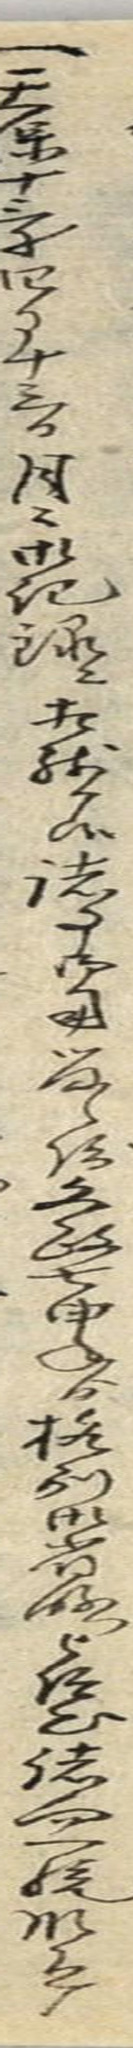一天保十三寅四月十三日月々御記録に相残り候諸事御用留之儀文政七申年ゟ格別御省略被仰出諸向一統御免？
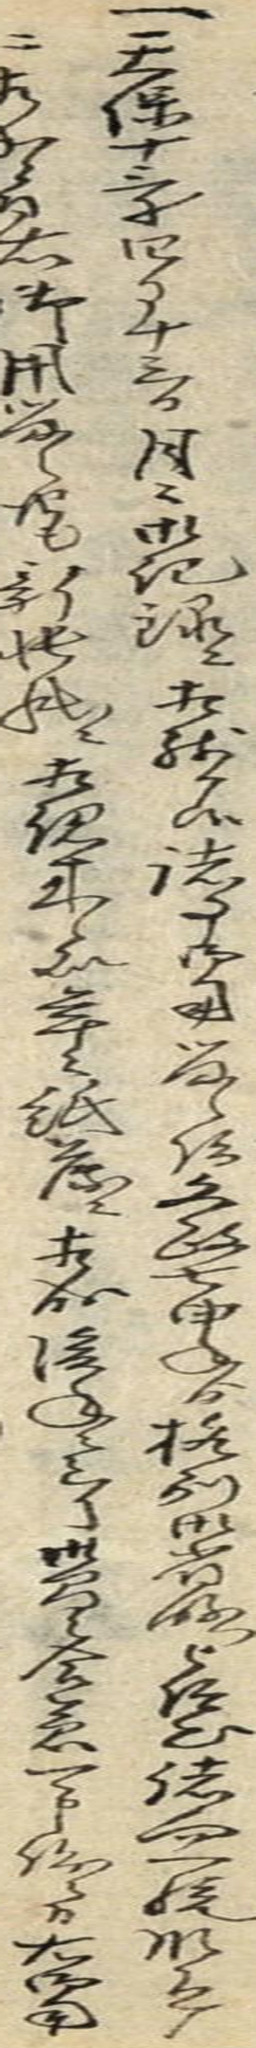に相成候に付右御用留之儀も新帳紙に相認来候処年々紙薄に相成後年に至り御間に合兼可申儀に付右御用
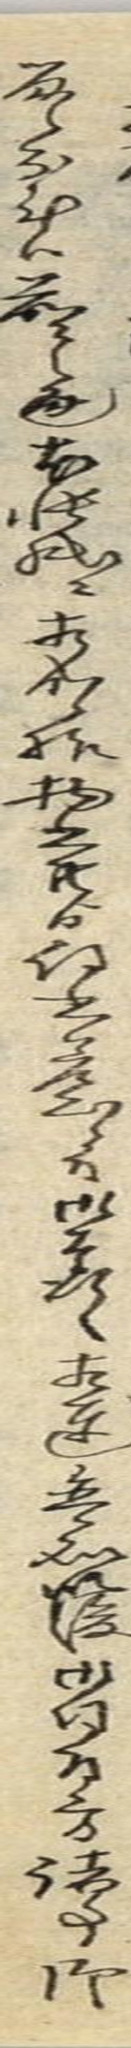留之分斗は前々之通本帳紙に相成候様物書共ゟ伺書差出候に付御奉行へ相達置候処以後御目付方諸事御
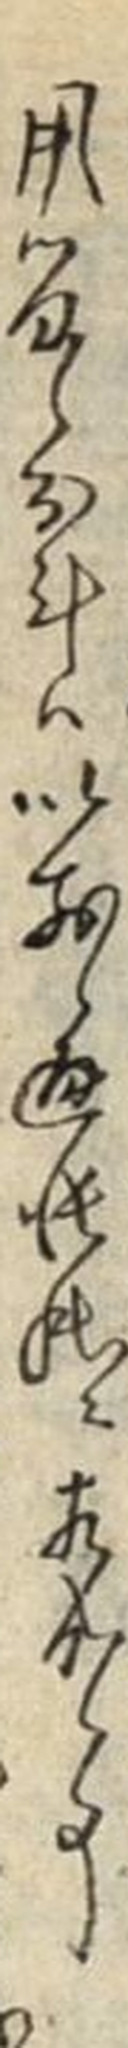用留之分斗は以前之通帳紙に相成候事
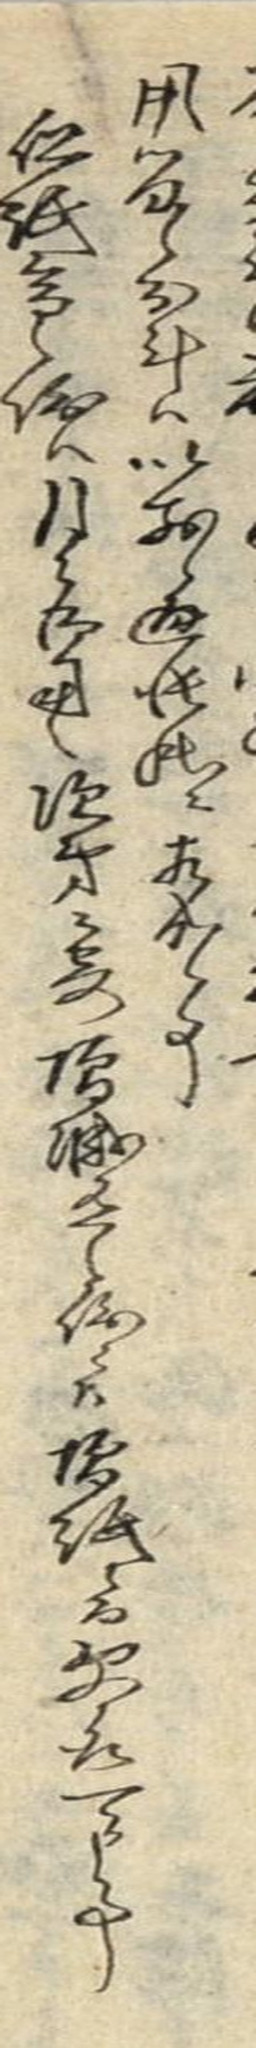但紙嵩之儀は月々御用之次第に寄増減有之儀に付増紙に而受取可申事
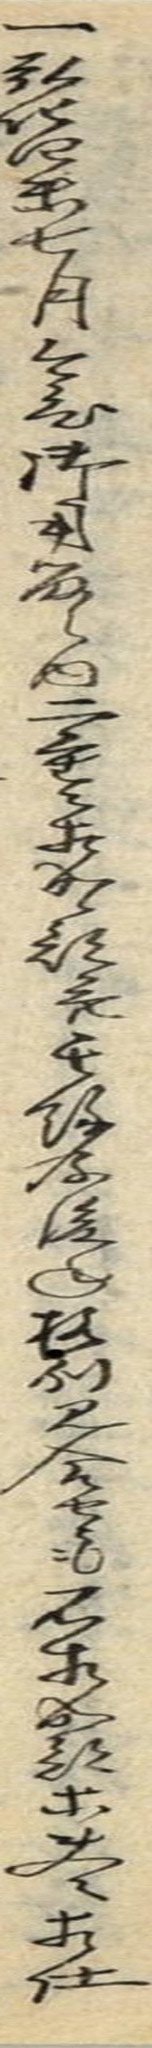一弘化四未七月今度御用留之内二重に相成候部并其餘及後年格別見合せにも不相成部等夫々相仕
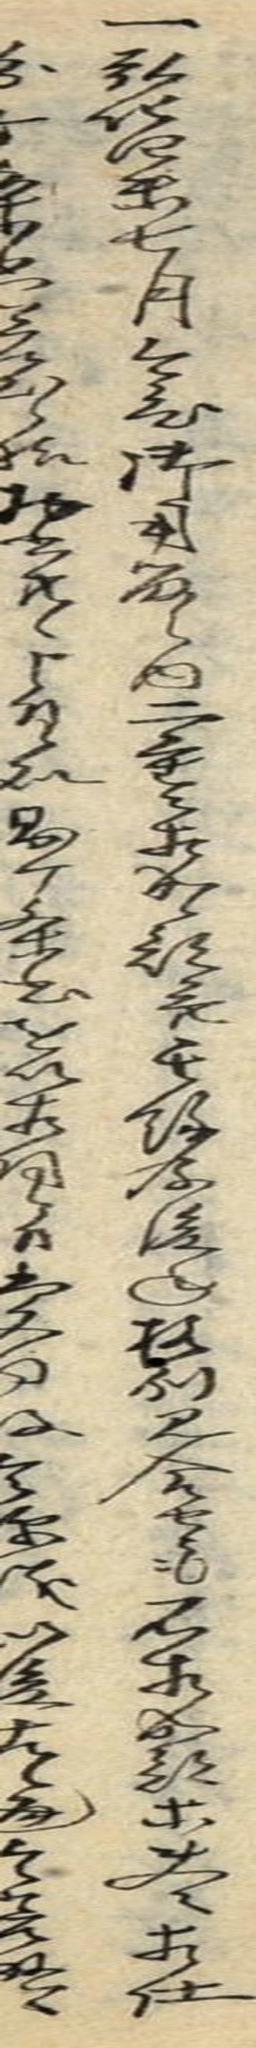分ケ条書差出候様物書共へ申付候処則ケ条書を以相伺候に付尚又同役令評議以後左之通令差略候事
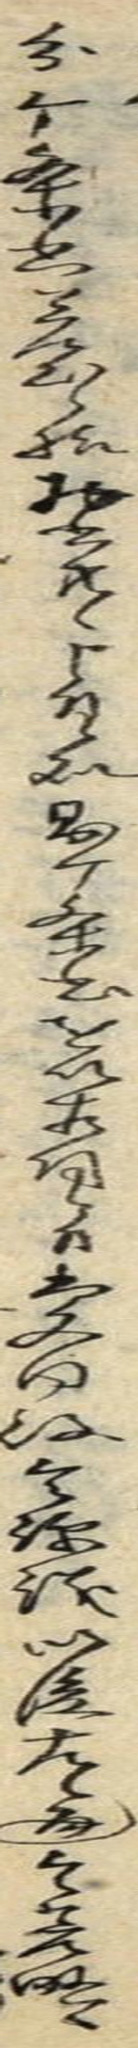分ケ条書差出候様物書共へ申付候処則ケ条書を以相伺候に付尚又同役令評議以後左之通令差略候事
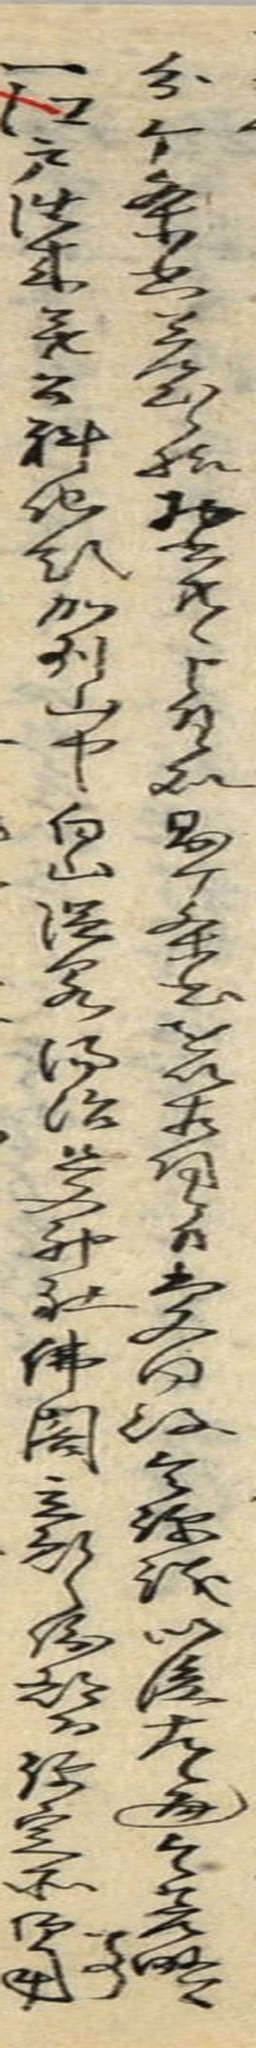一江戸往来并公料他領加州山中白山温泉湯治且又神社仏閣立願之儀都而評定所御用
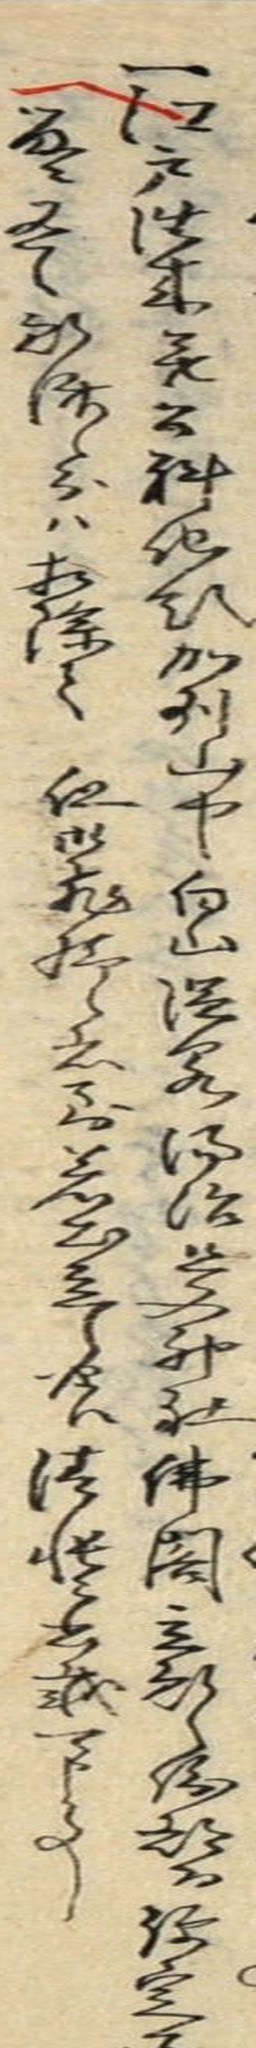留に有之願済之分は相除之但御飛脚之者到着出立之儀は請帳へ書載可申事

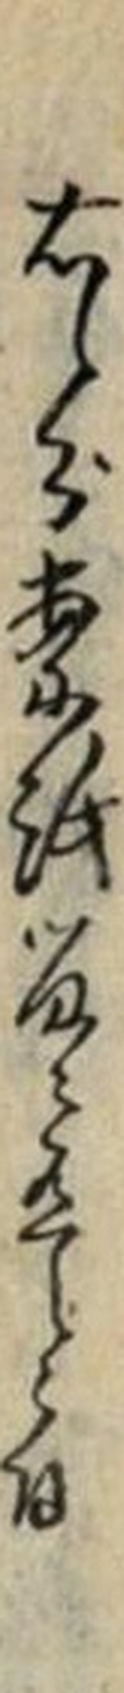右之分案紙留に有之候に付
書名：蒐輯之部
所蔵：福井県文書館 Fukui Prefectural Archives
